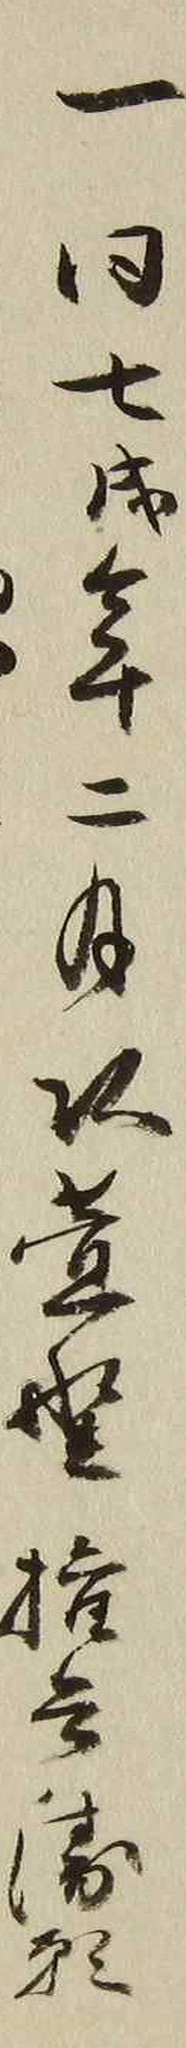一同七戌年二月頭萱野権兵衛願
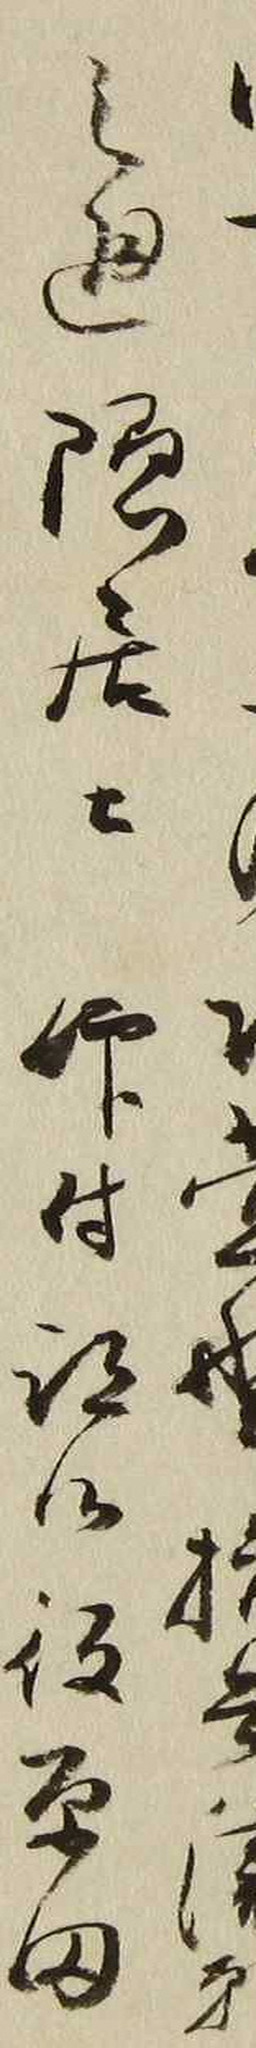之通隠居被仰付跡御役原田
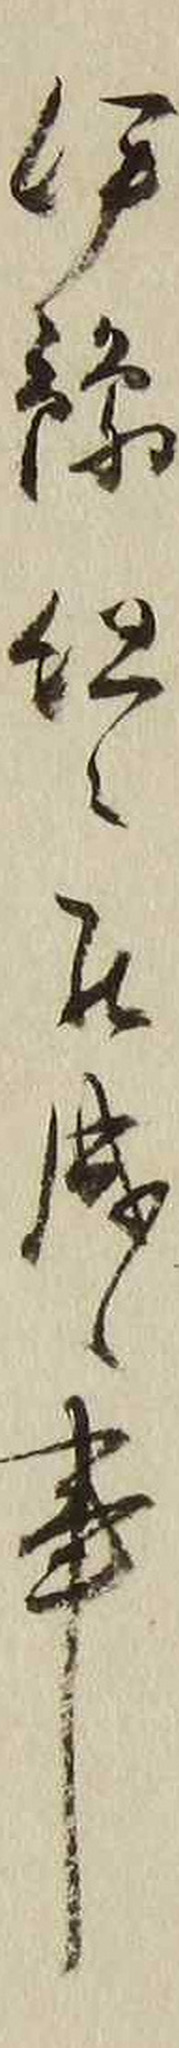伊予組ニ罷成候事
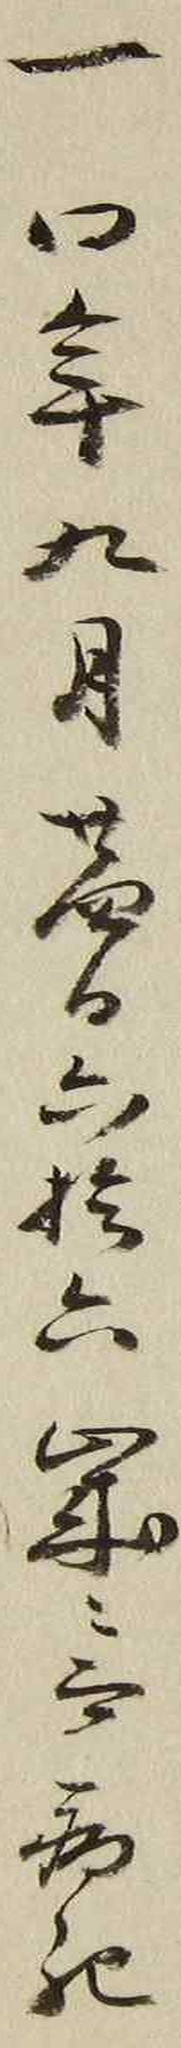一同年九月廿四日六拾六歳ニ而病死
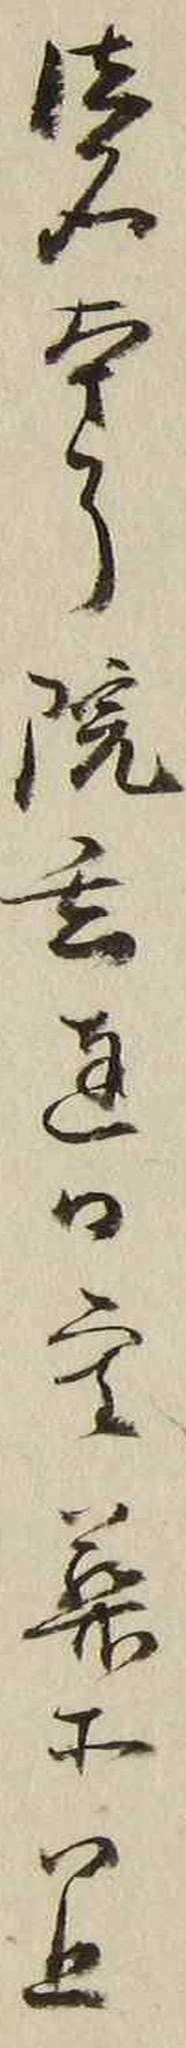法名本了院玄達日空葬所同上

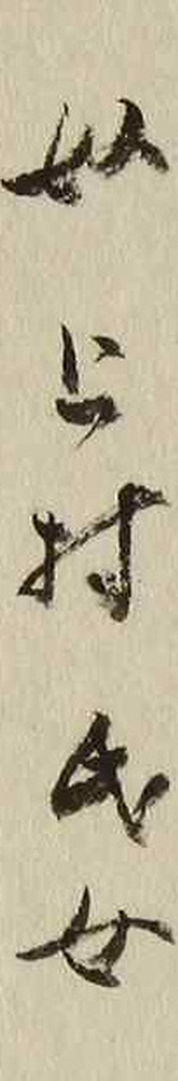母上村氏女
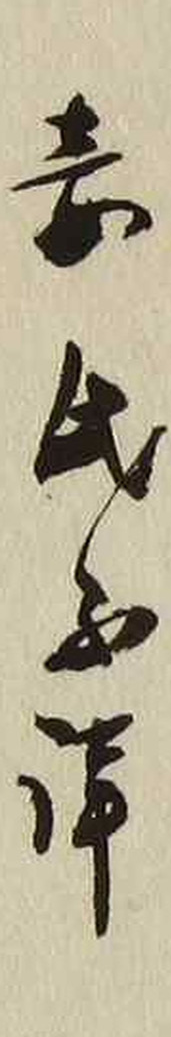妻氏不詳
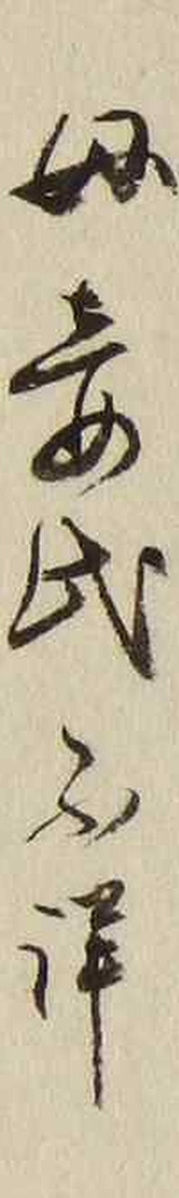母妻氏不詳

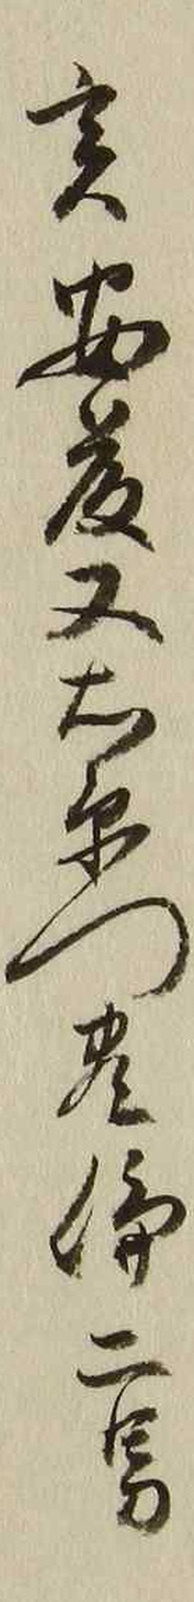実安藤又右衛門盡倫二男
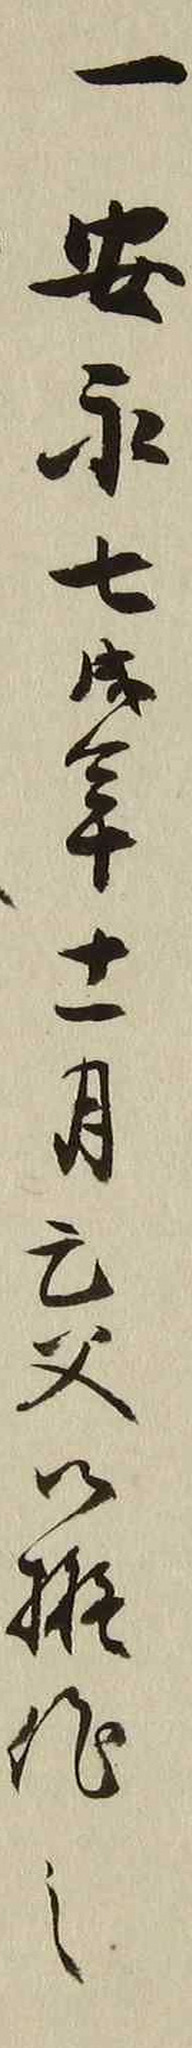一安永七戌年十一月亡父御擬作之
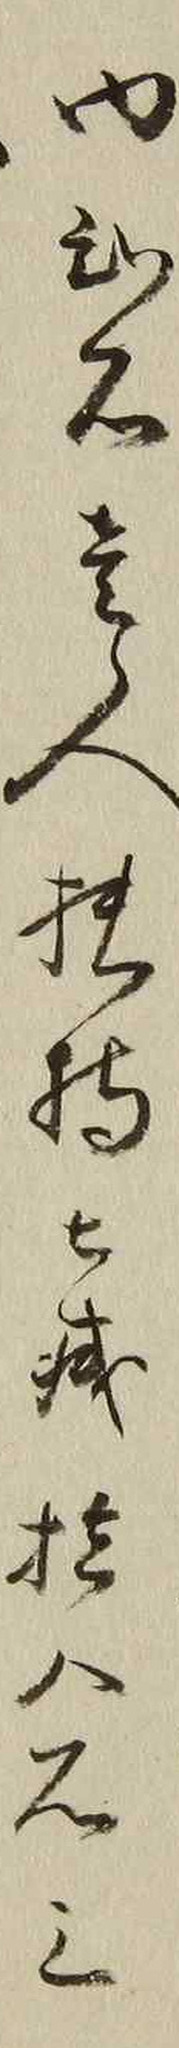内弐石壱人扶持被減拾八石三
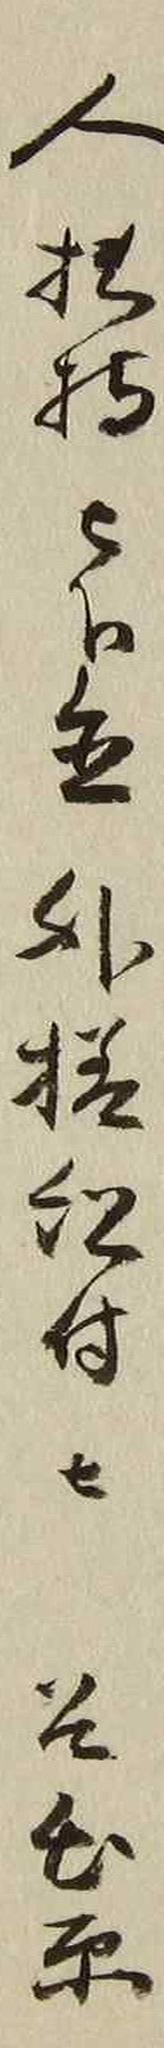人扶持被下置外様組付被召出原
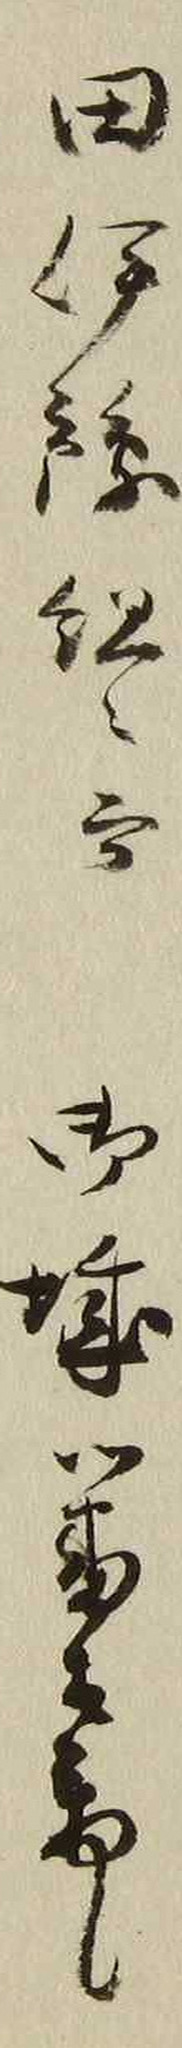田伊予組ニ而御城御番相勤候
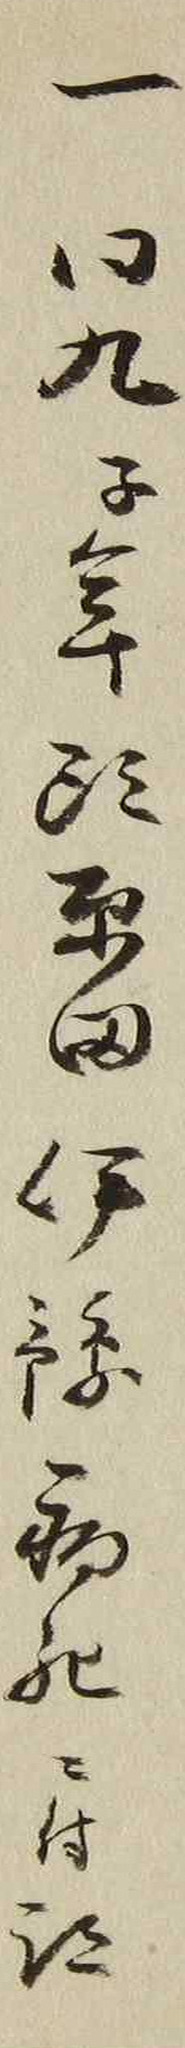一同九子年頭原田伊予病死ニ付跡
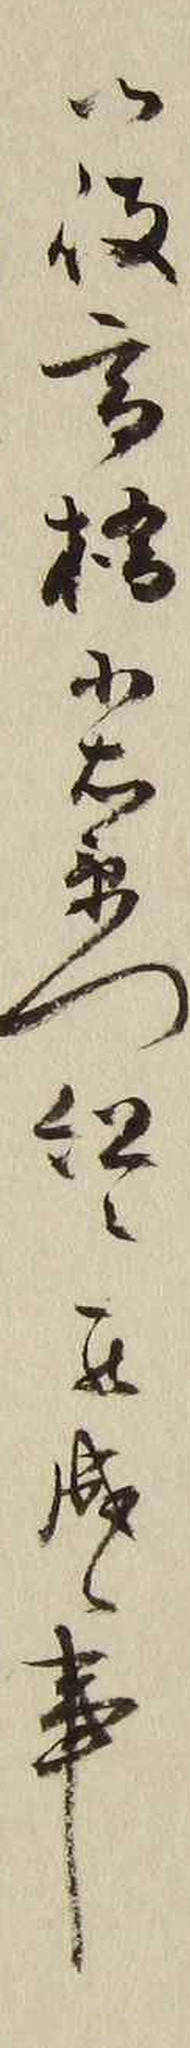御役高橋小右衛門組ニ罷成候事
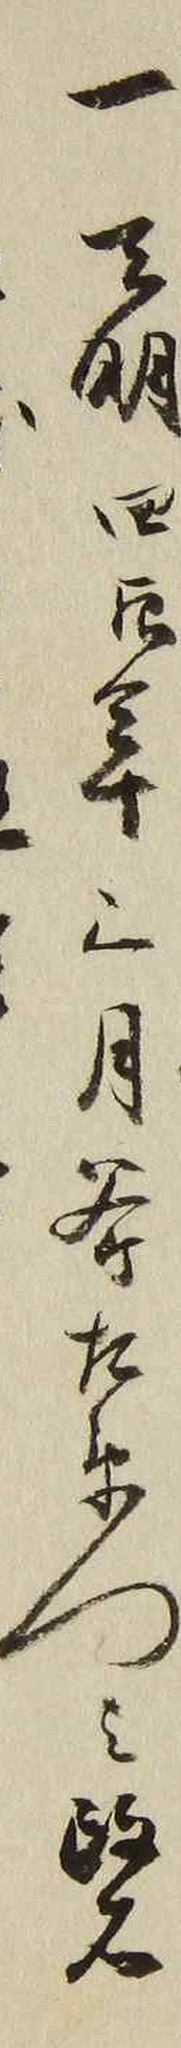一天明四辰年三月斧左衛門与改名
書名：諸士系譜　巻之288　さ之部20
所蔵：会津若松市立会津図書館
